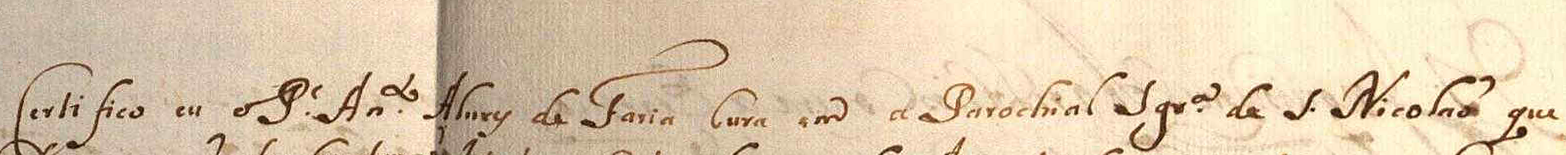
Certifico eu o P.e An.to Alures de Faria Cura em a Parochial Igr.a da S. Nicolaō que
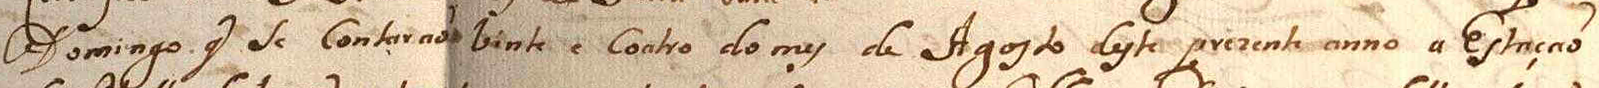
Domingo q̄ se Contaraõ vinte e Coatro do mes de Agosto deste prezente anno a Estaçaõ
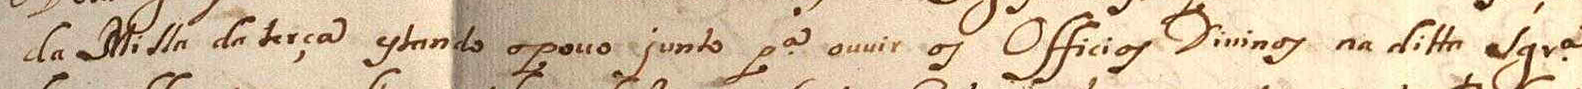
da Missa da terça estando o pouo junto p.a ouuir os Officios Diuinos na ditta Igr.a
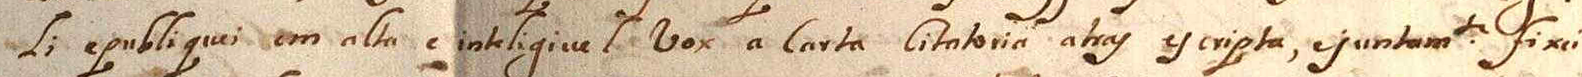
Li e publiquei em alta e inteligiuel Vox a Carta Citatoria atras escripta, e juntam.te fixei
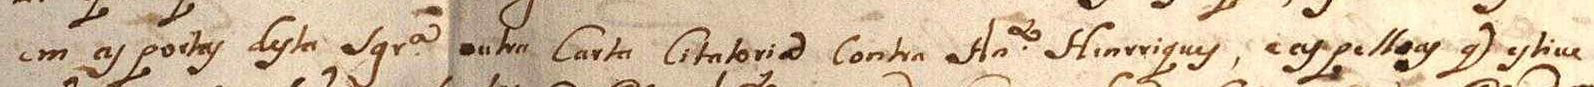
em as portas desta Igra outra Carta Citatoria Contra An.to Henrriques, e as pessoas q̄ estiue
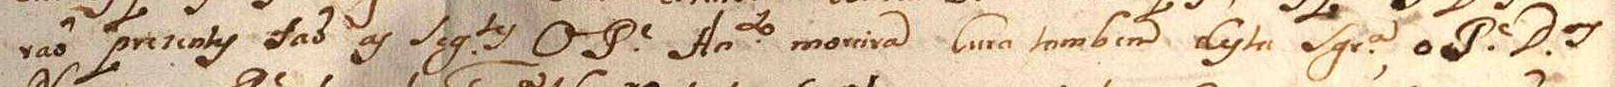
raõ presentes saõ as seg.tes O P.e An.to moreira Cura tambem desta Igr.a, o P.e D.os
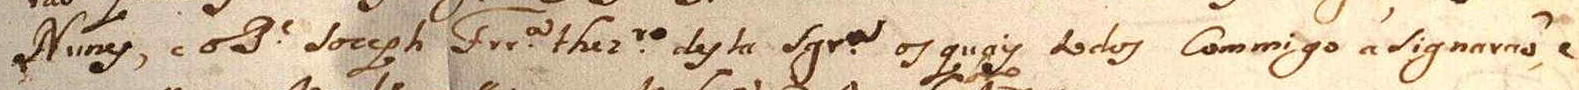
Nunes, e o P.e Iozeph Frr.a thez.ro desta Igr.a os quais todos Commigo asignaraõ, e
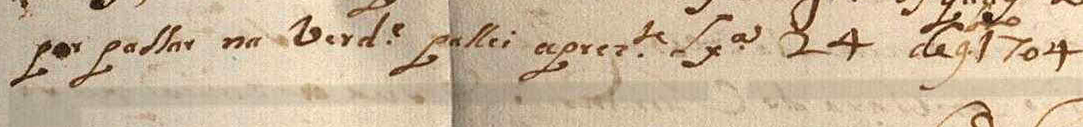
por passar na Verd.e passei a prez.te Lx.a 24 de 9.bro 1704
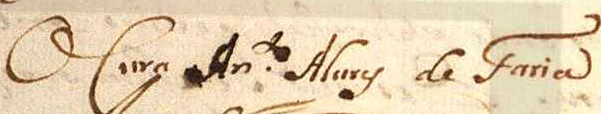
O Cura An.to Alures de Faria
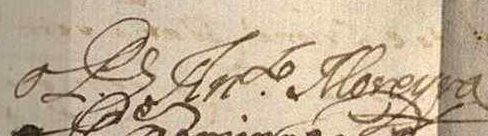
o P.e An.to Moreyra
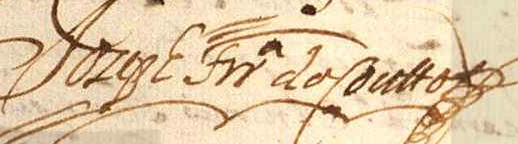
Iozeph Frra do Coutto
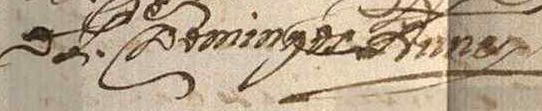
o P. Domingos Nunez
